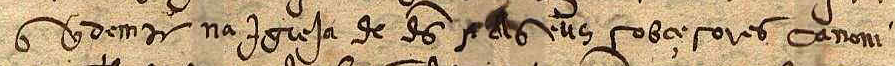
sydemte na JgreJa de ds̄ e A seus sobcesores canoni
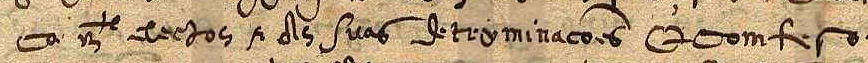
camte electos e As Suas detryminações E comfeso
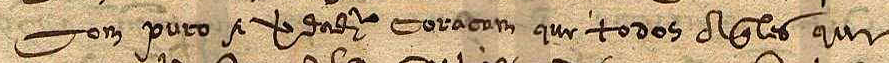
Com puro e ꝟdadiro coraçam que todos Aq̄les que
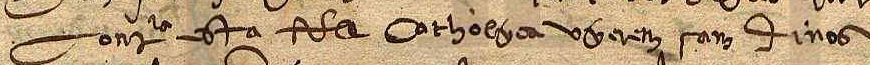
Contra esta ffee Catholyca vyerem sam dinos
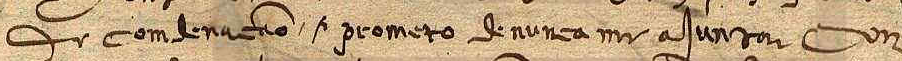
de comdenação / e prometo de nunca me aJuntar Com
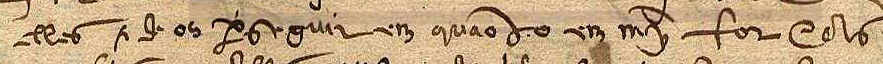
elles e de os ꝑseguir emquãoto em mȳ for e As
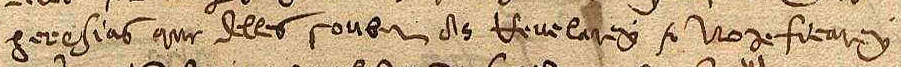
heresias que delles souber as Reuelarey e Noteficarey
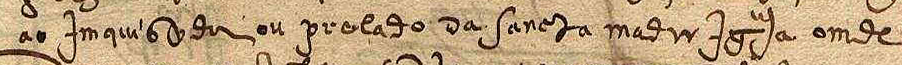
ao Jmquisydor ou prelado da Sancta madre JḡJa omde
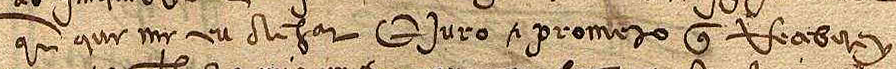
q̄r que me eu Achar E Juro e prometo q̄ Receberey
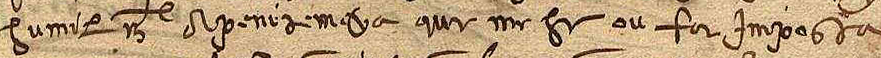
humiLmte A penitemcya que me he ou for Jmposta
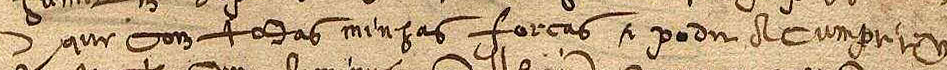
e que com todas minhas forças e poder A cumprirey
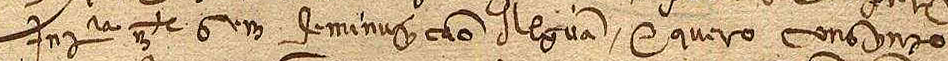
Jntramte sem deminuyção Alguā / e quero consynto
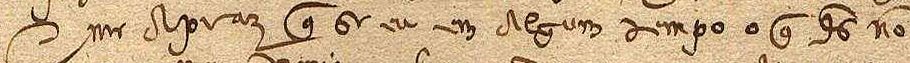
e me Apraz q̄ se eu em Algum tempo o q̄ ds̄ nō
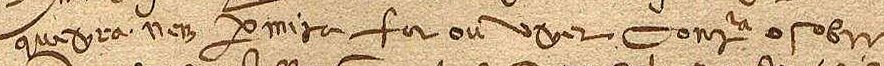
queyra nem ꝑmita for ou vyer Contra o sobre
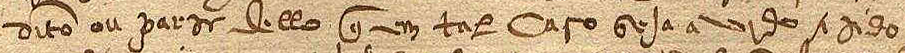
dīto ou parte dello q̄ em taL Caso seja avjdo e tido
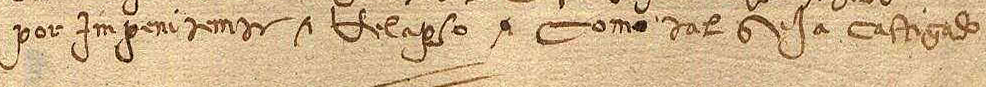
por Jmpenitemte e Relapso e Como tal seJa castigado
